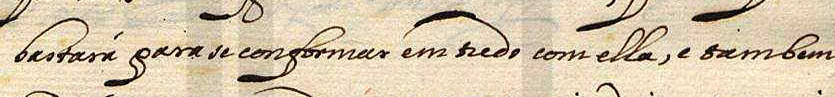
bastará para se conformar em tudo com ella, e tambem
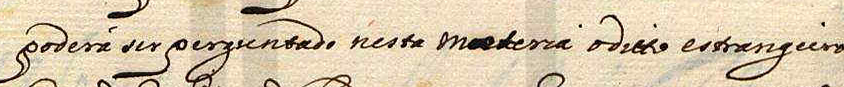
poderá ser perguntado nesta materia o ditto estrangeiro
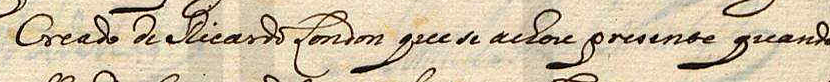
Creado de Ricardo London que se achou presente quando
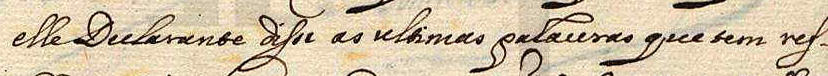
elle Declarante disse as ultimas palauras que tem ref
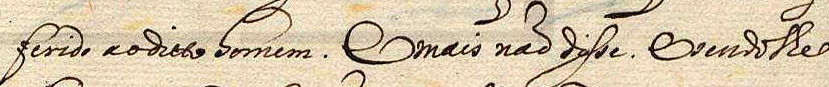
ferido ao ditto homem. E mais naõ disse. E sendolhe
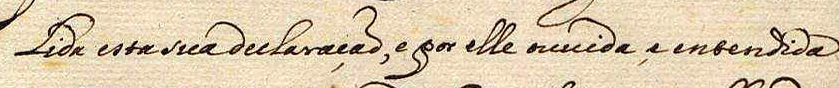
Lida esta sua declaraçaõ, e por elle ouuida, e entendida
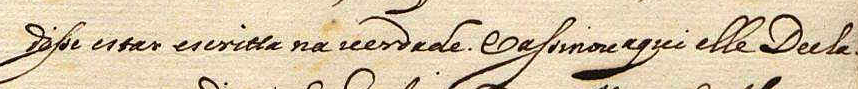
disse estar escritta na uerdade. E assinou que elle Decla
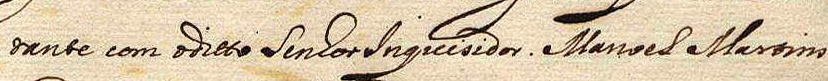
rante com o ditto Senhor Inquisidor. Manoel Martins
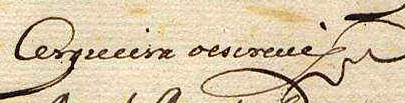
Cerqueira o escreui
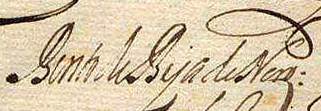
Bento de Beja de Noro
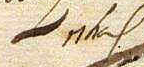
nha
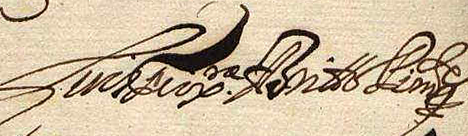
Luis Teix.ra Britto Pim.tel
